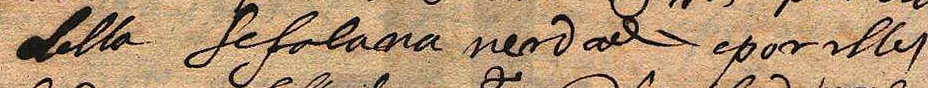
della se falaua uerdade e por elles
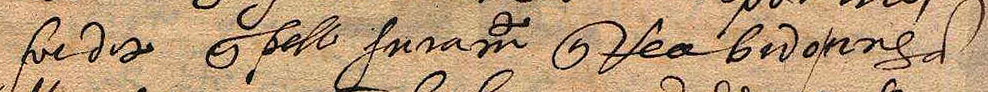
foi dito q̄ pello Juramto q̄ Recebido tinhaõ
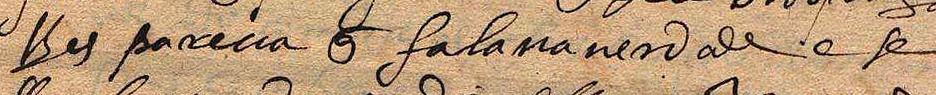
lhes parecia q̄ falaua uerdade e se
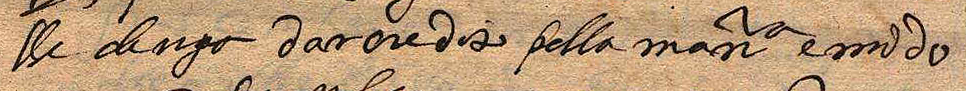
lhe deuja dar credito pella manra e modo
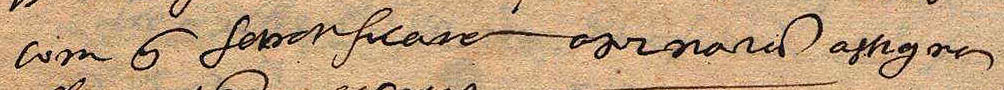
com q̄ se ratificara a tornaraõ assignar
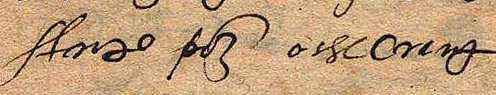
Anto piz̄ o esccreuj
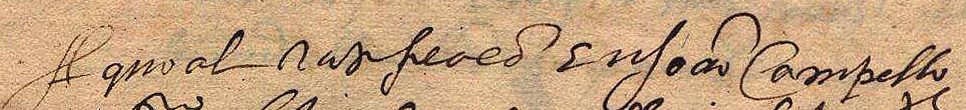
A quoal ratificacō Eu Joaõ Campello
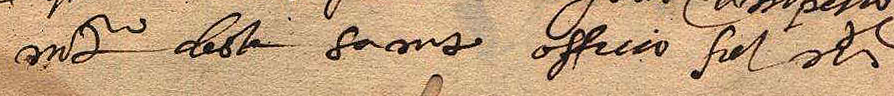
notro deste samto officio fielmte
